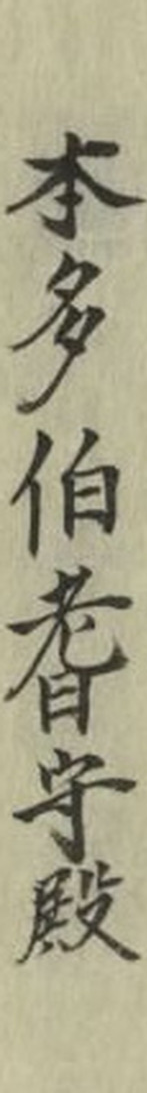本多伯耆守殿
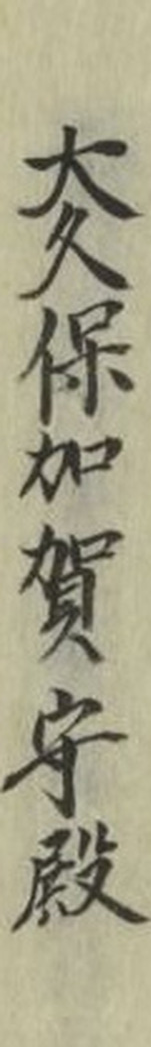大久保加賀守殿
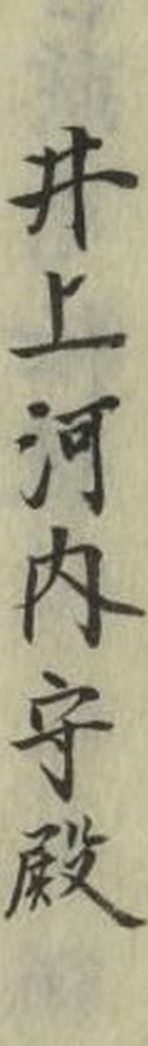井上河内守殿
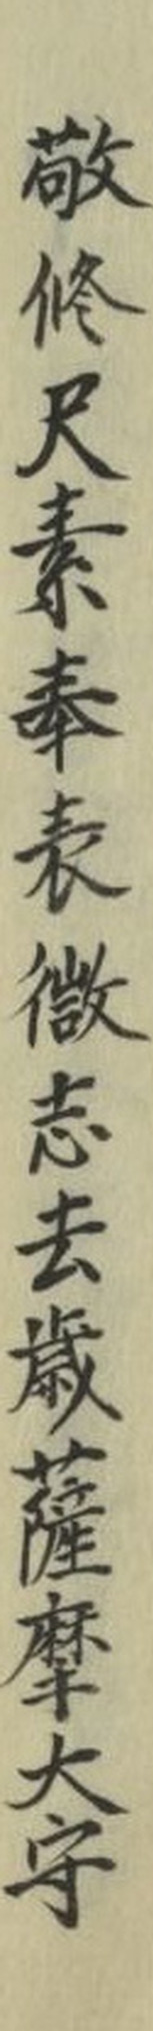敬修尺素奉表微志去歳薩摩大守
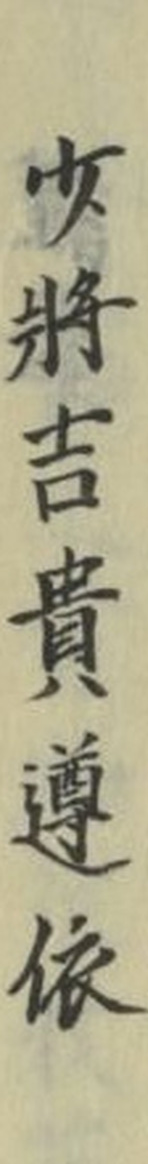少将吉貴遵依
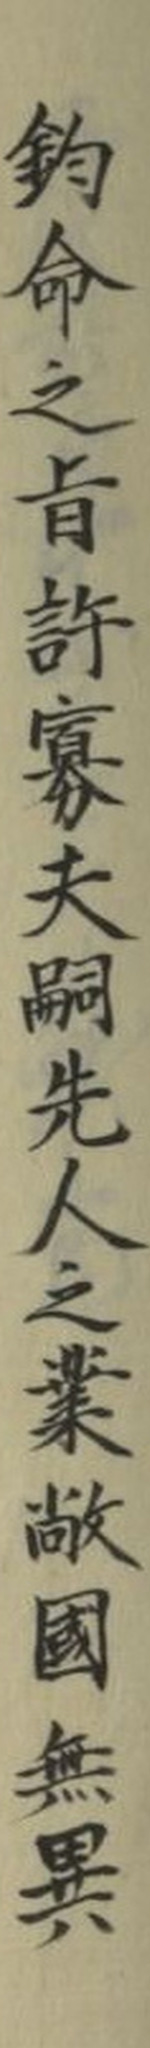鈞命之旨許寡夫嗣先人之業敞国無異
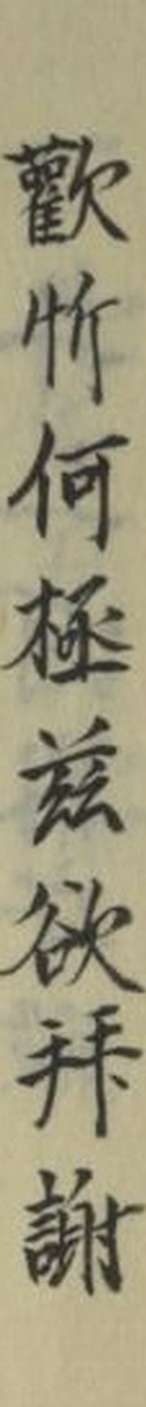歓忻何極茲欲拝謝
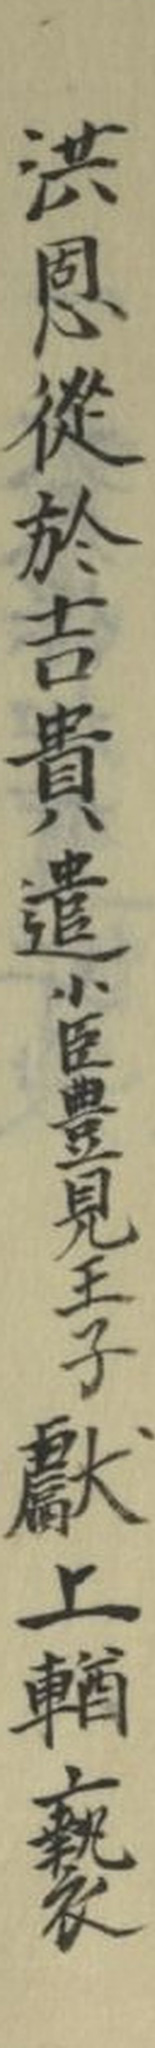洪恩従於吉貴遣小臣豊見王子献上輶褻
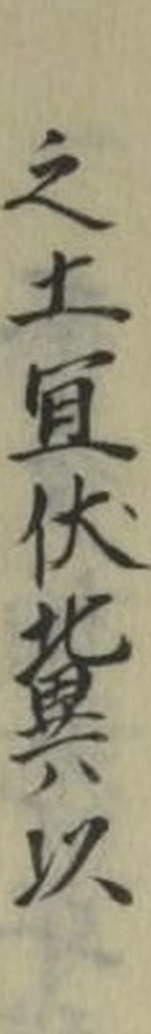之土宜伏冀以
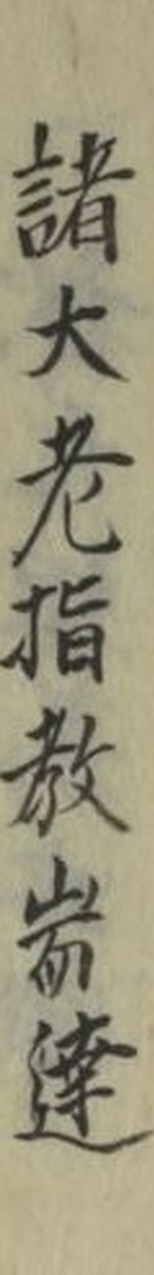諸大老指教耑達
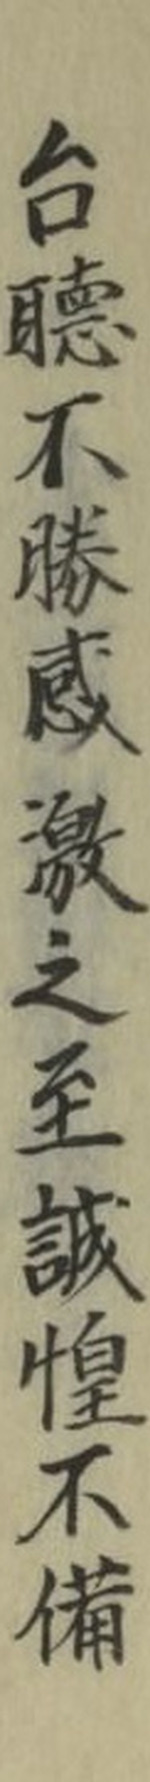台聴不勝感激之至誠惶不備
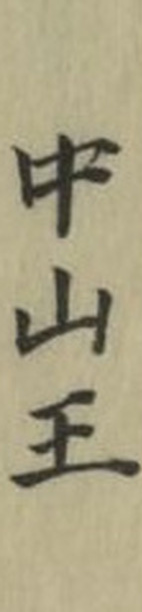中山王
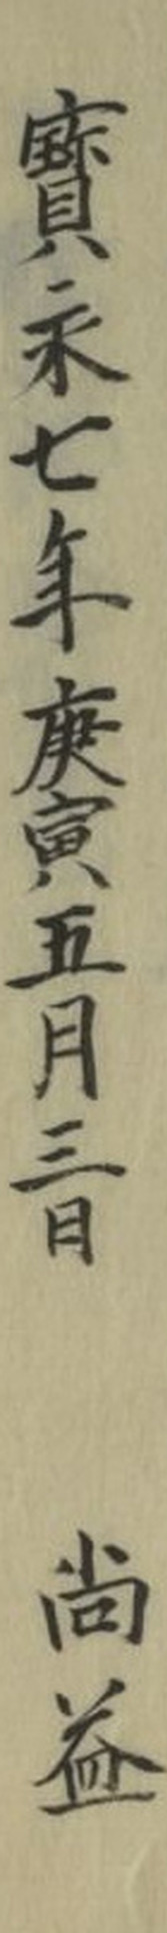宝永七年庚寅五月三日尚益

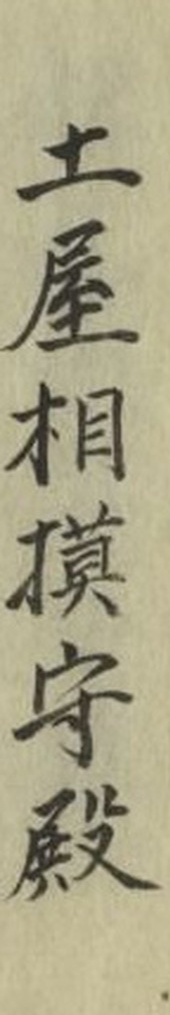土屋相模守殿
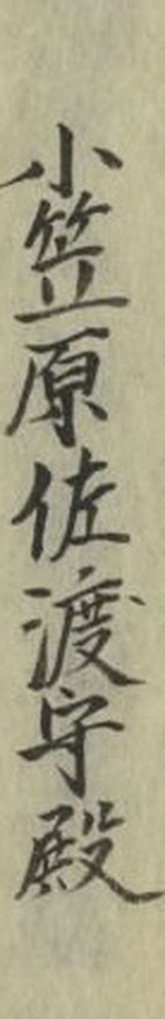小笠原佐渡守殿
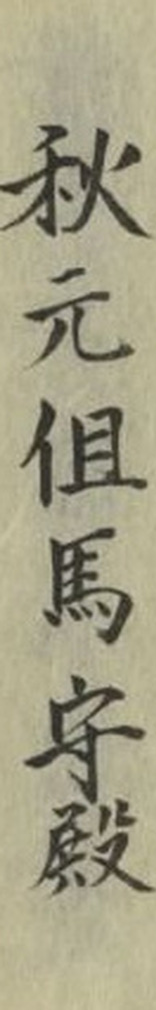秋元但馬守殿
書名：琉球人参府記
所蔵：University of the Ryukyus Library
